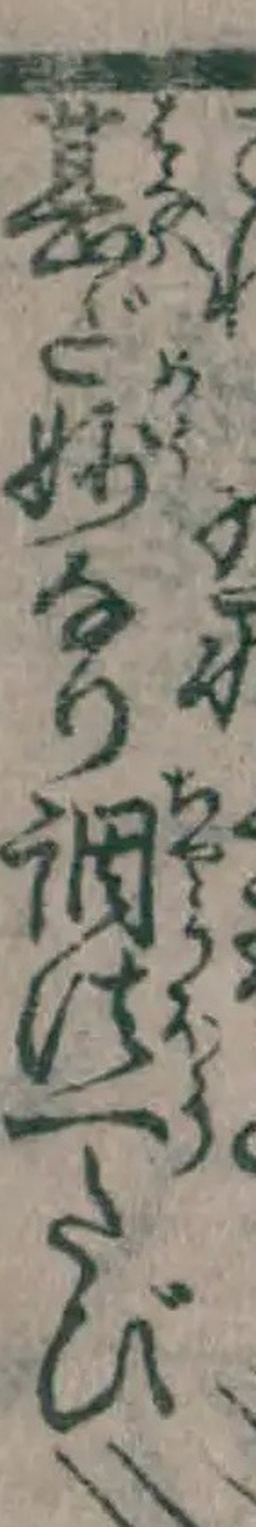甚だ妙なり調法一たび
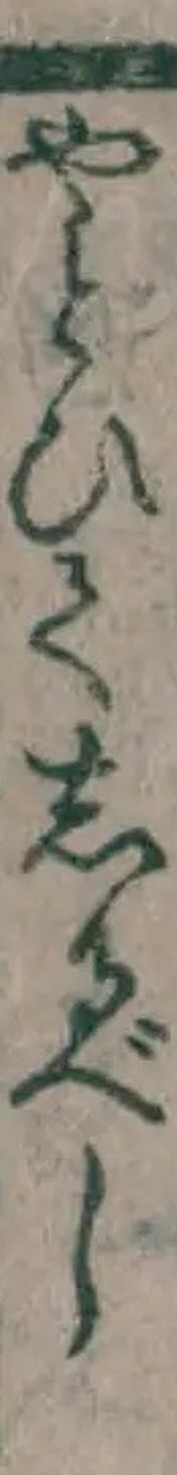やとひてしるべし

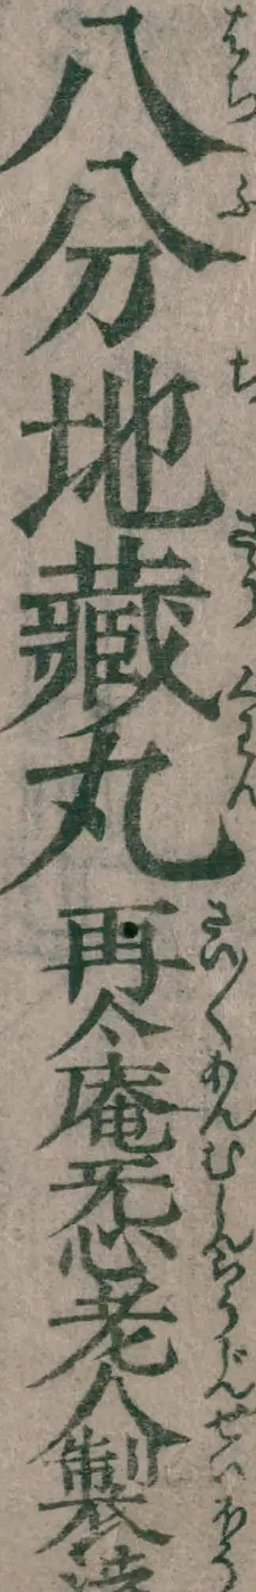八分地蔵丸再仝庵无心老人製法
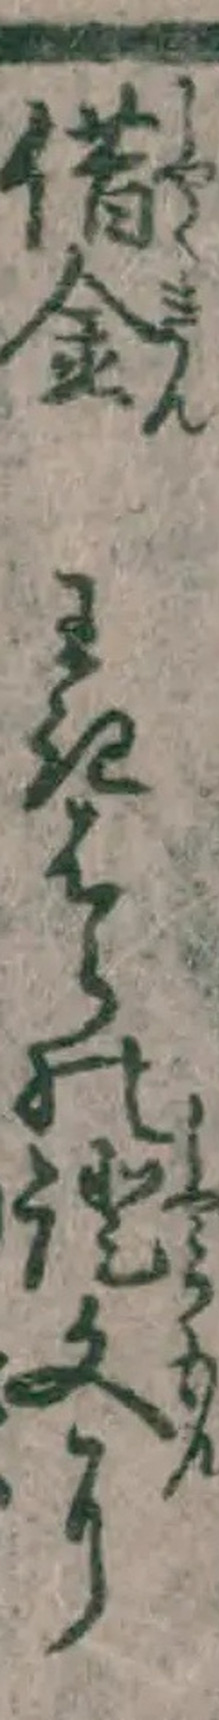借金わきはらの証文に
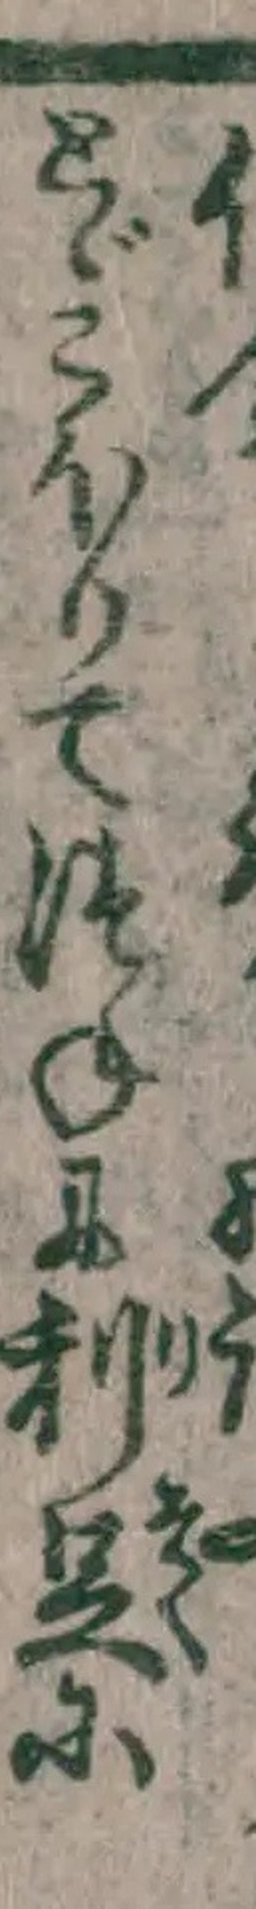とゞこほりてつねに利足に
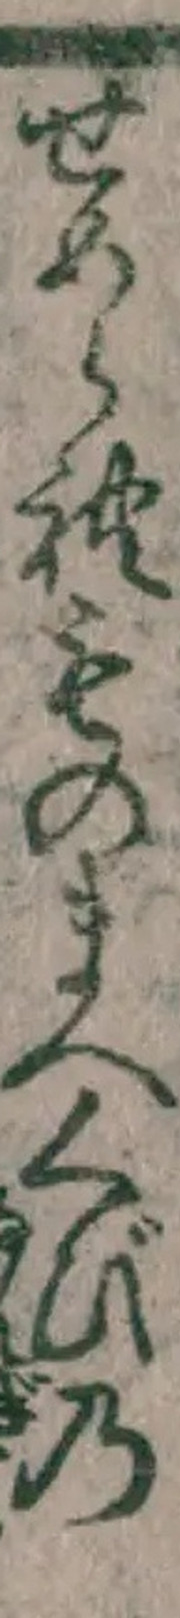せめられものまへくびの
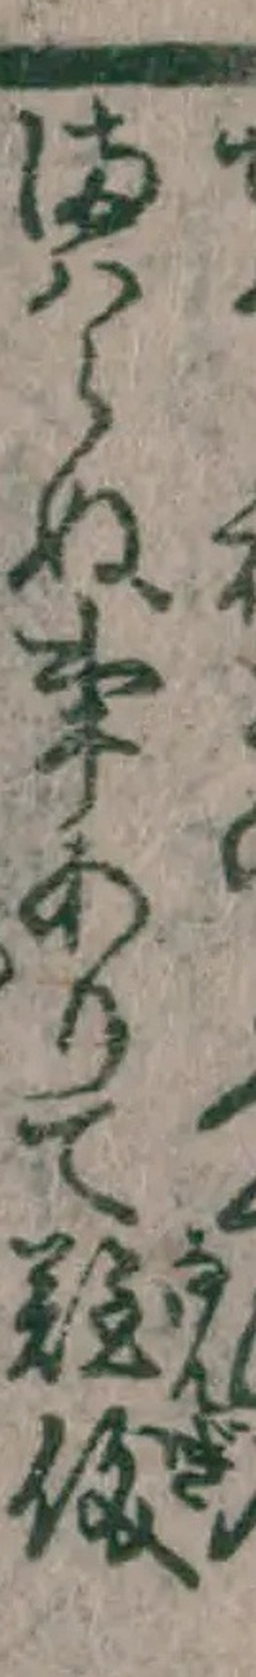まはらぬ事ありて難儀
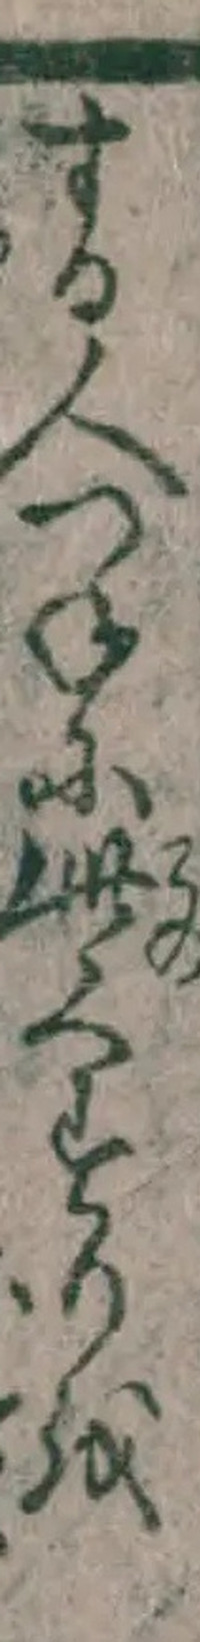する人つねに此くすりを
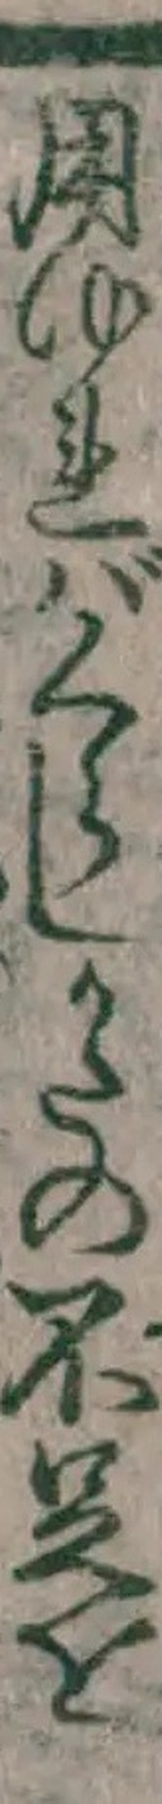用ゆればくらしかたの不足を
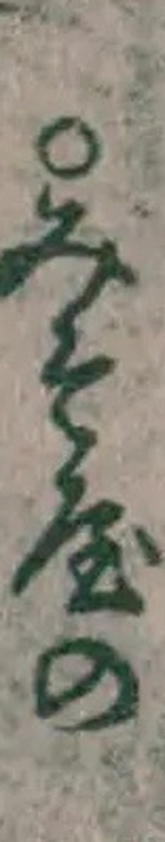○みそ屋の
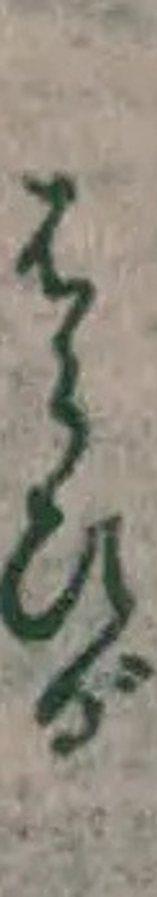はらひが
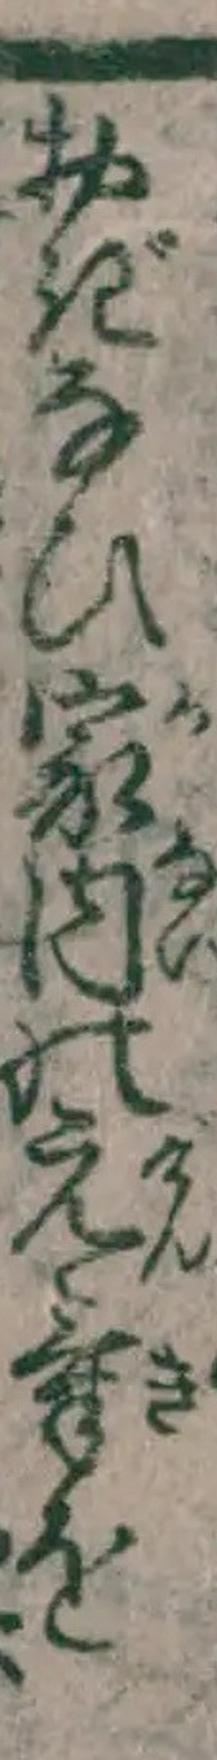おぎなひ家内の元気を
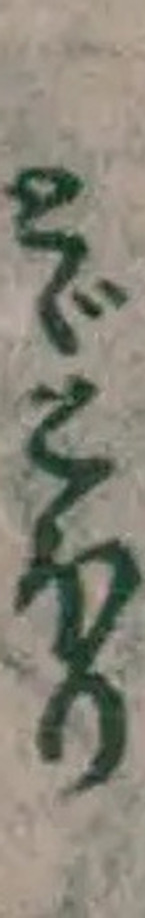とゞこほり
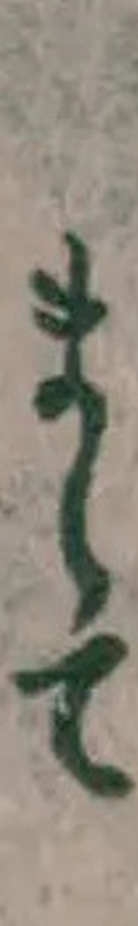まして
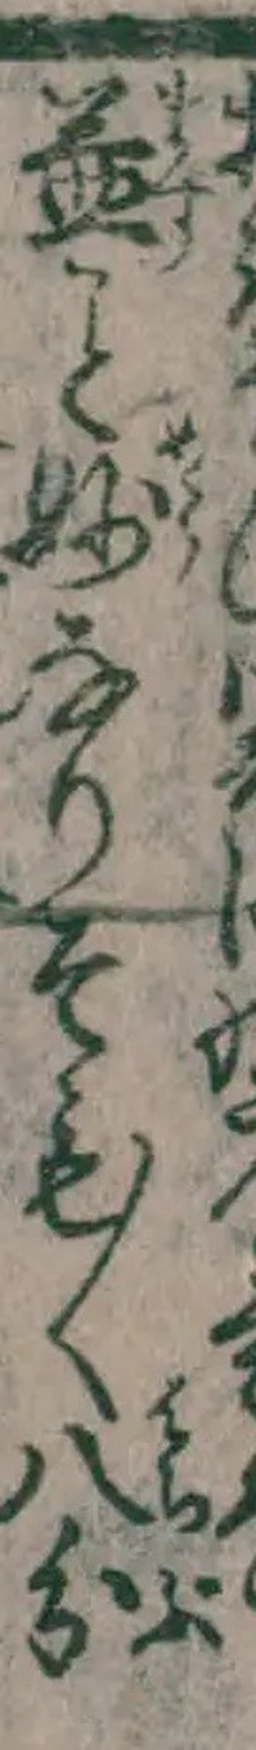益こと妙なりそも〳〵八分
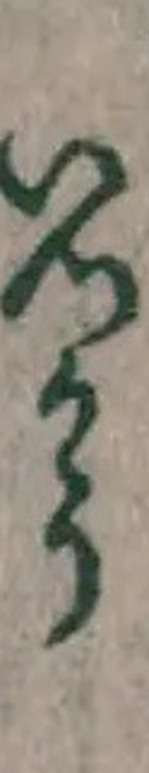いつかう
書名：視薬霞報条 3巻
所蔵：国立国会図書館 National Diet Library, JAPAN
